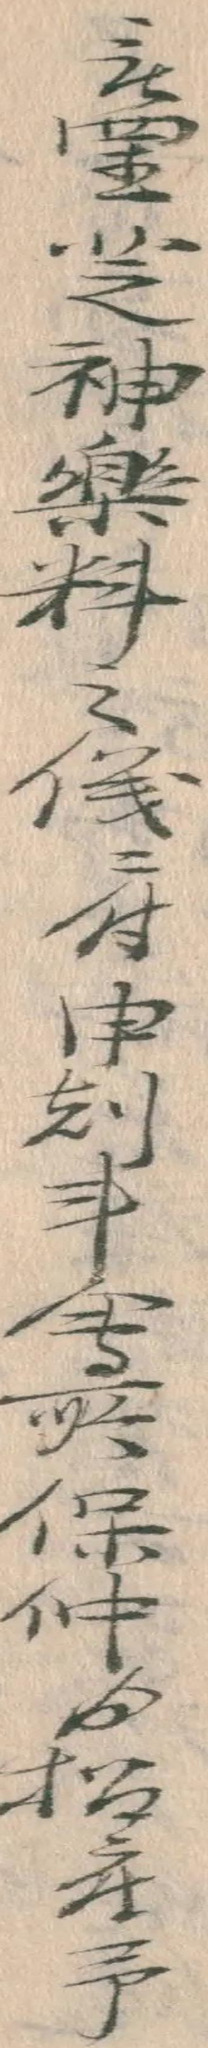被置芝神楽料之儀ニ付申刻斗會所保仲ゟ招ニ付予
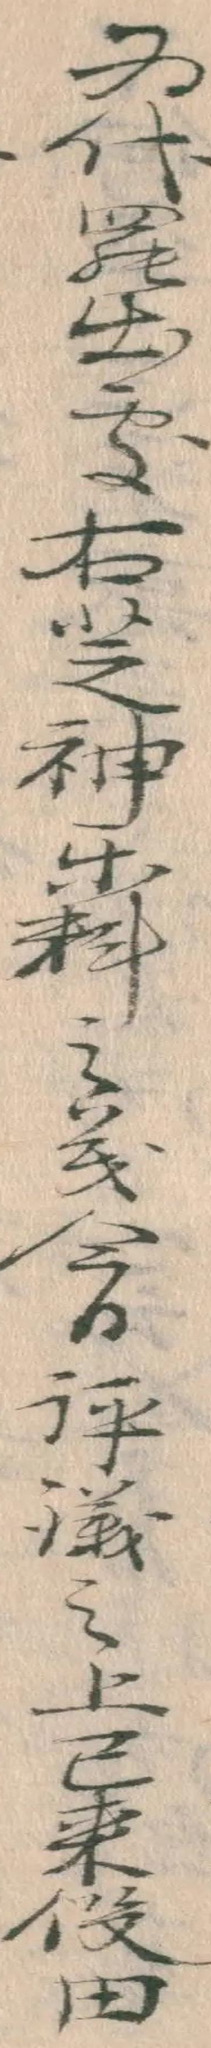為代罷出處右芝神楽料之義今日評議之上已来役田
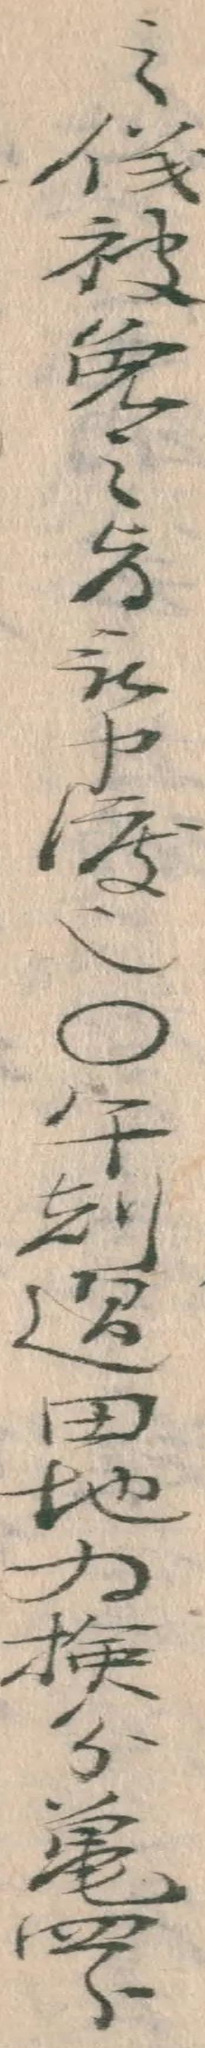之儀被免之旨被申渡也〇午刻過田地為検分亀四郎
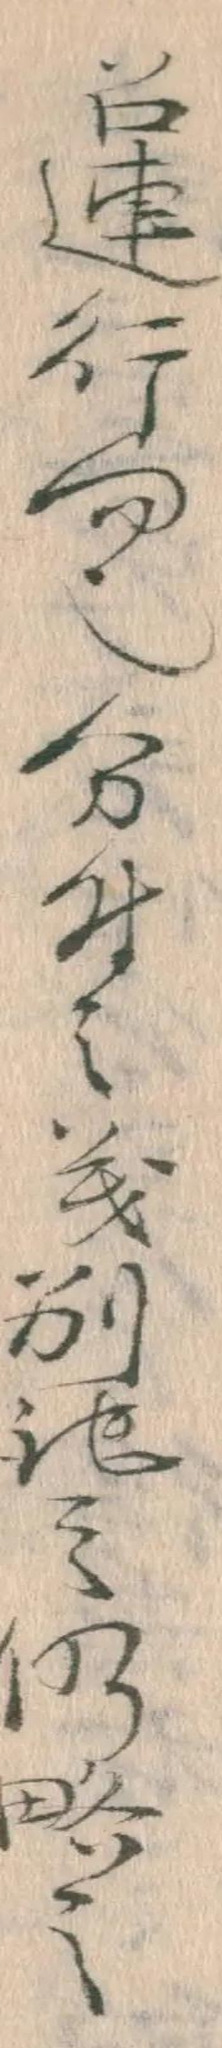召連行向也分付之義別記之仍略之
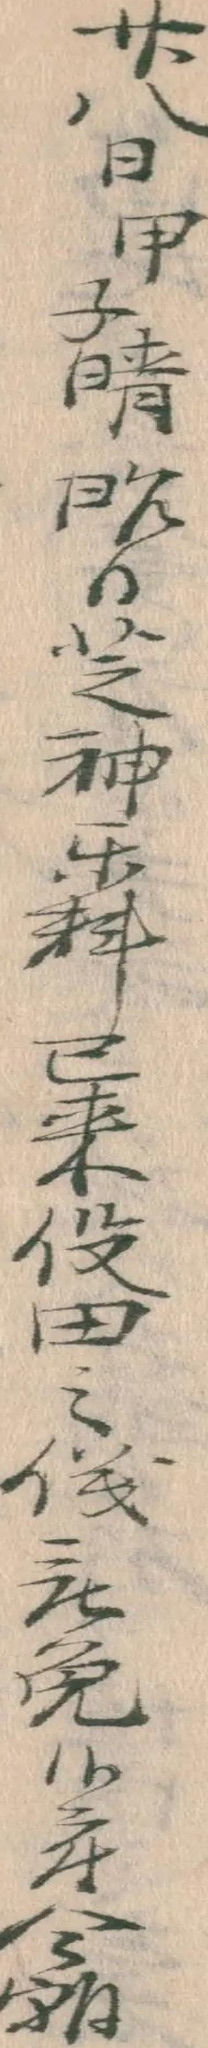廿八日甲子晴昨日芝神楽料已来役田之儀被免候ニ付今朝
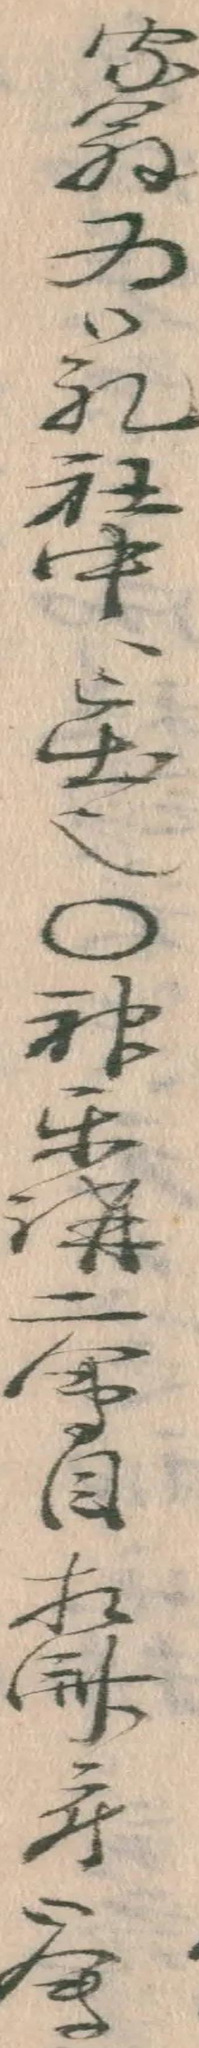家翁為御礼社中へ被出也〇神楽講二會目相済ニ付御會
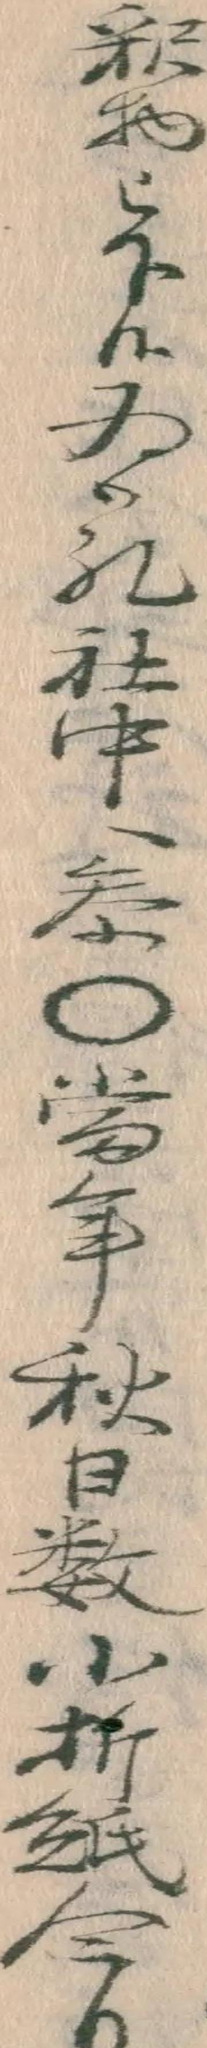釈物被下候為御礼社中へ参〇当年秋日数小折紙今日
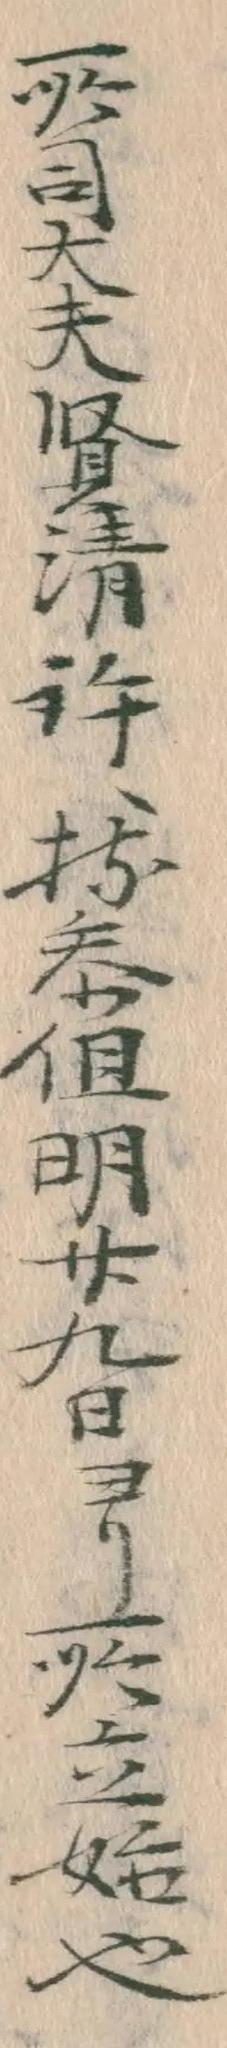所司大夫賢清許へ持参但明廿九日ヨリ所立始也
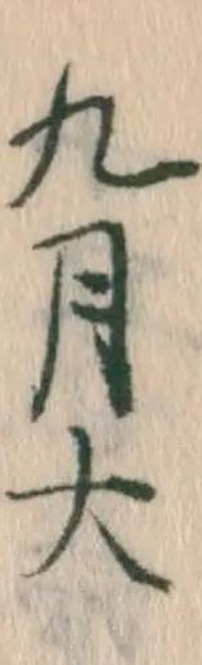九月大
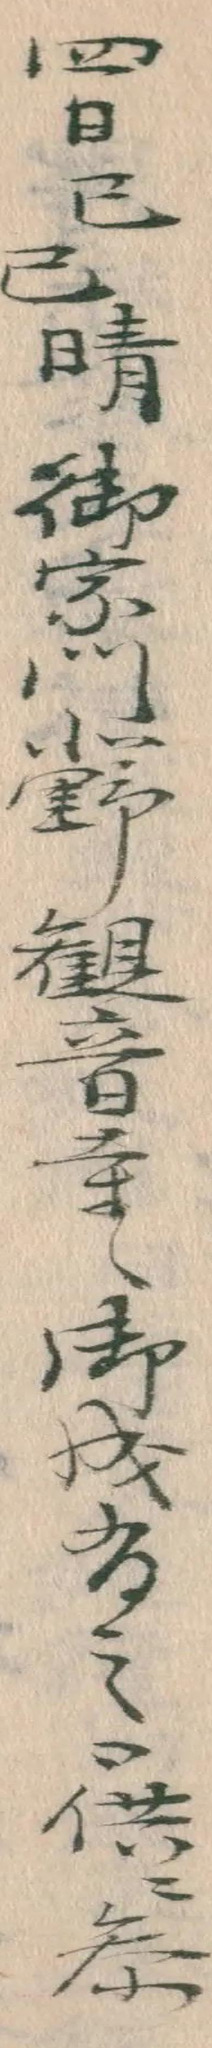四日己巳晴御家門北野観音寺へ御成有之御供ニ参
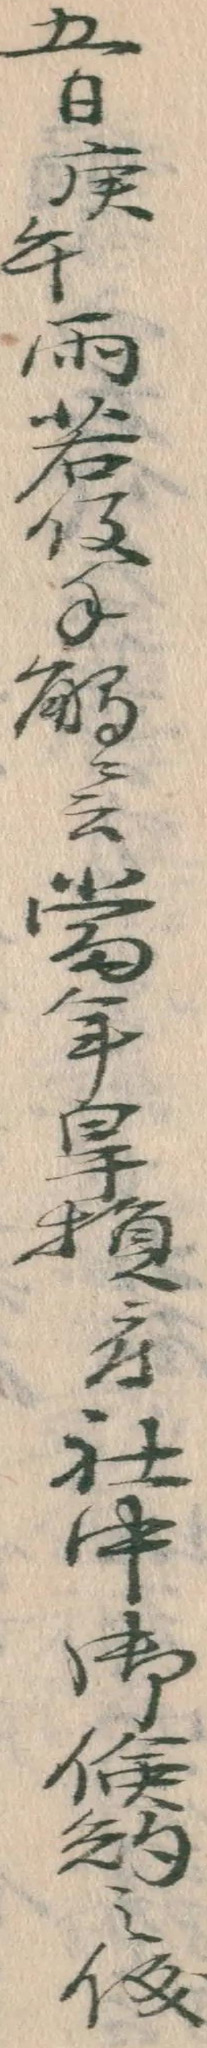五日庚午雨若役手触云々当年旱損ニ付社中御倹約之儀
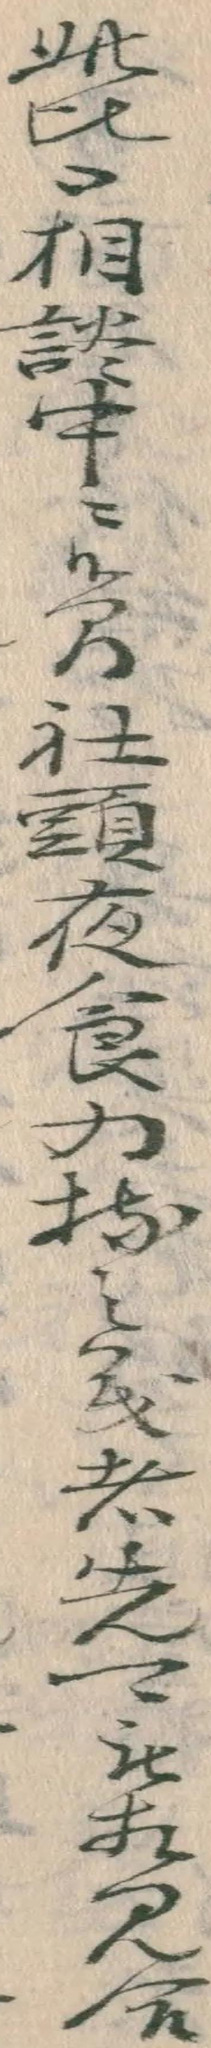此頃御相談中ニ候間社頭夜食為持之義者先可被相見合
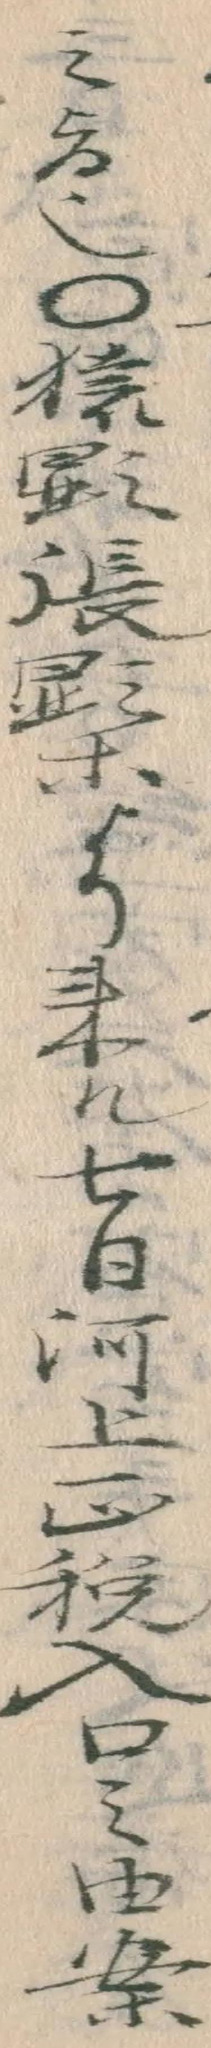之旨也○猿顕張顕等より来ル七日河上正税入口之由案
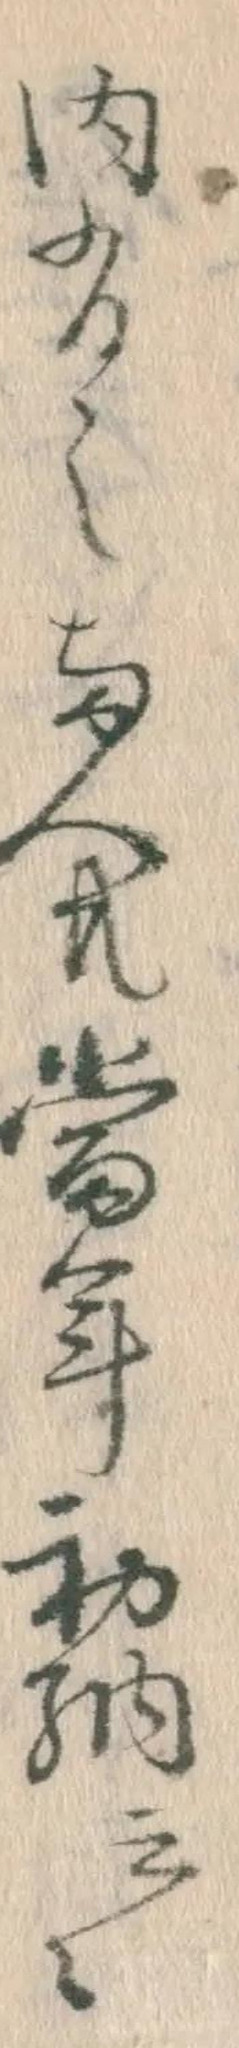内有之両人共当年初納云々
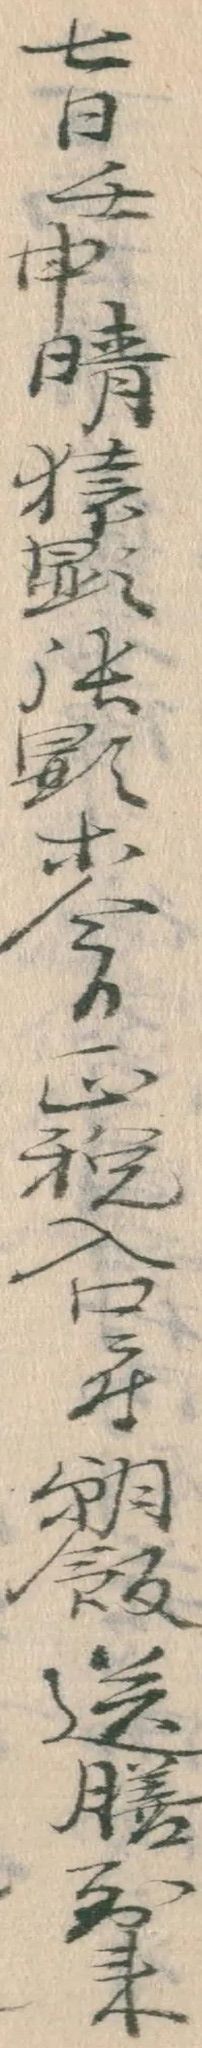七日壬申晴猿顕張顕等今日正税入口に付朝飯送膳到来
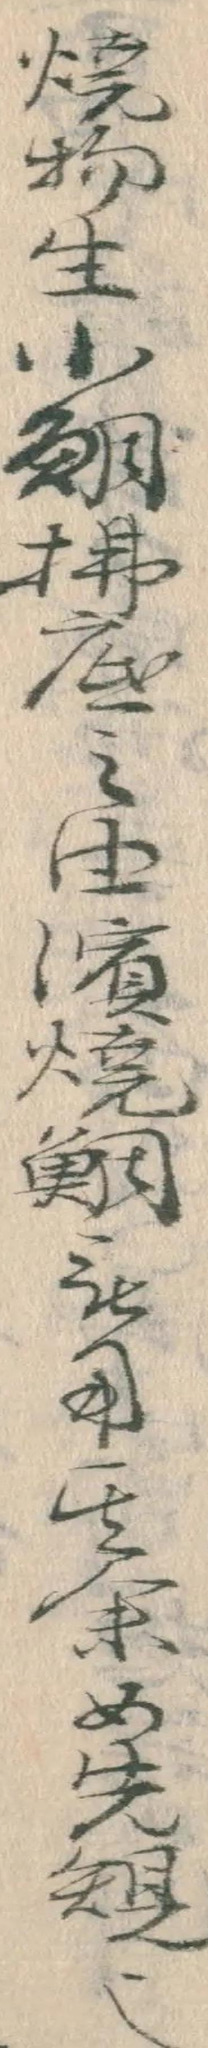焼物生小鯛払底之由浜焼鯛被用其余如先規也
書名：賀茂社記録. 第64冊
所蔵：国立国会図書館 National Diet Library, JAPAN
